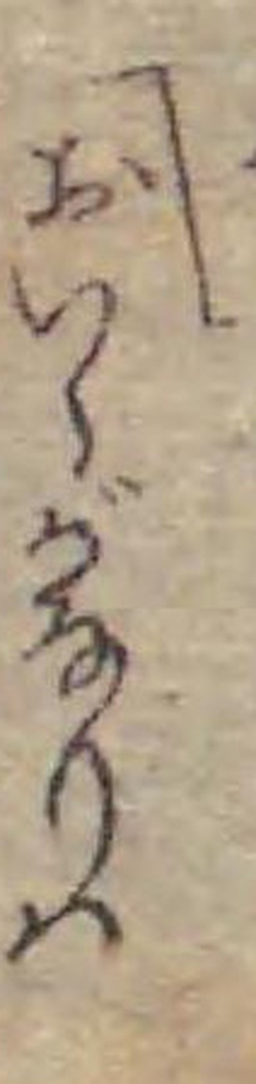〽おいらがなりは
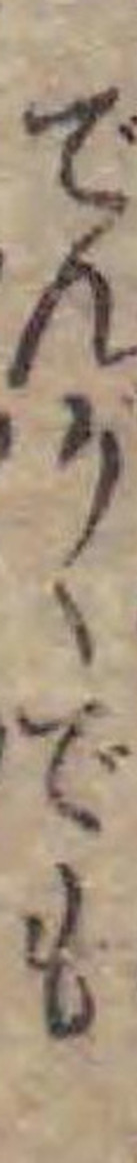でんがくでも
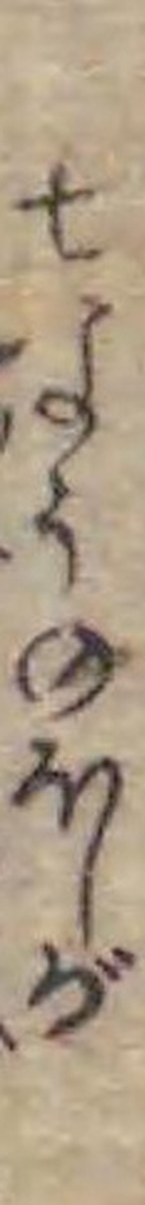七ようのほしが
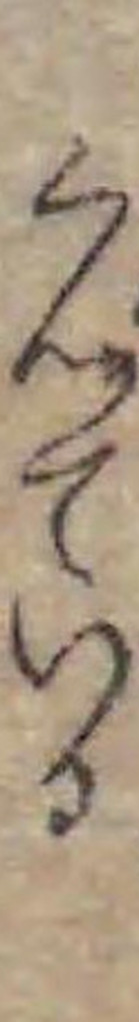思つている
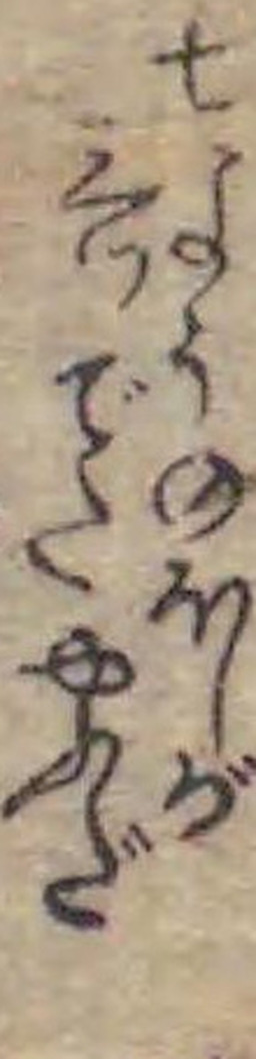三つでたやふだ
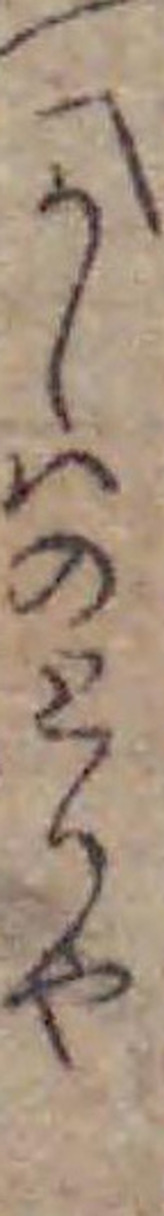〽かしはのとりや
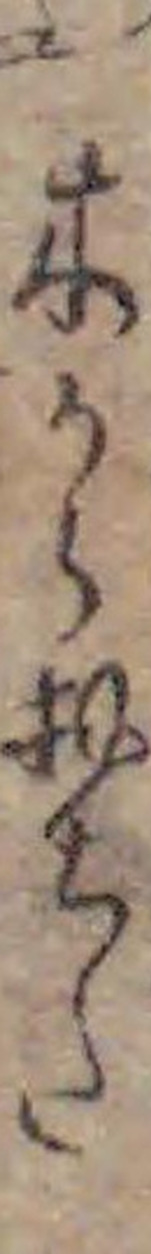木からおちた
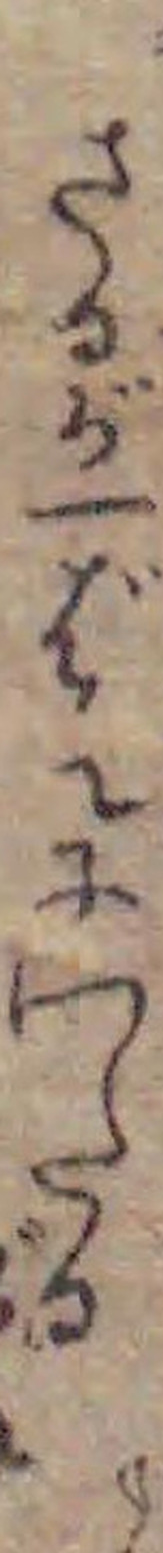さるが一ばんにわたる

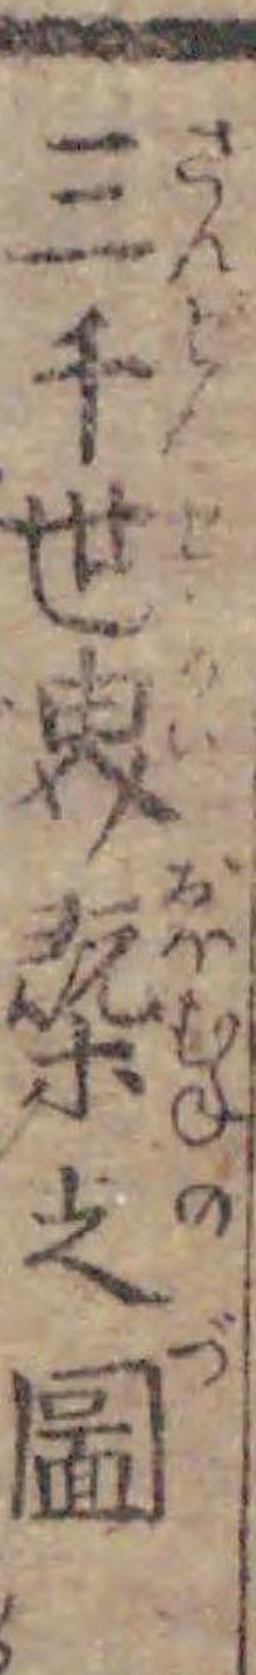三千世界概之図
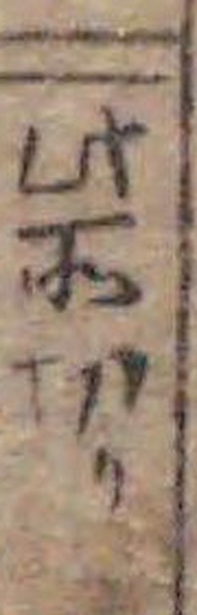此所切り
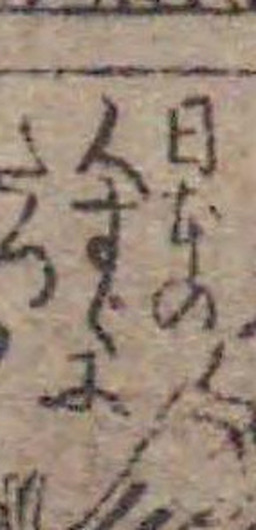人すぐに
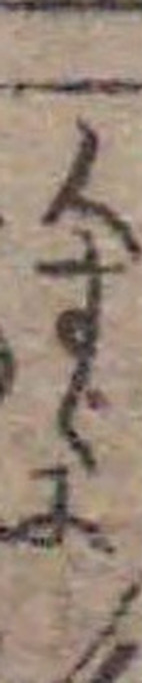人すぐに
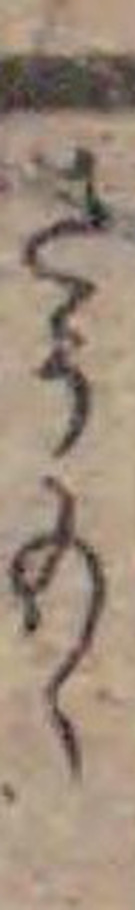さうもく
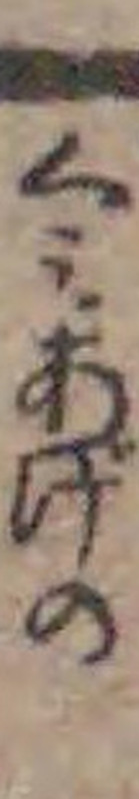くみあげの
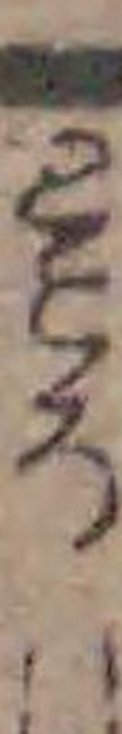ところ
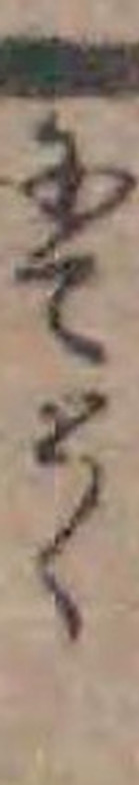にてとく
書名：奇妙頂礼胎錫杖 : 3巻
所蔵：国立国会図書館 National Diet Library, JAPAN
